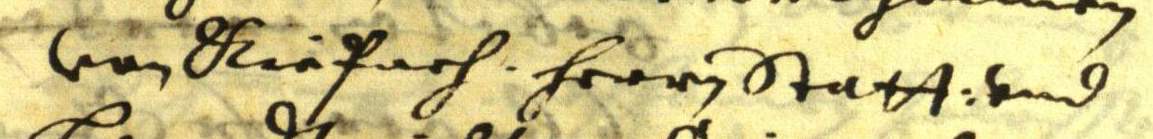von KiePach. herrn Statt: vnd
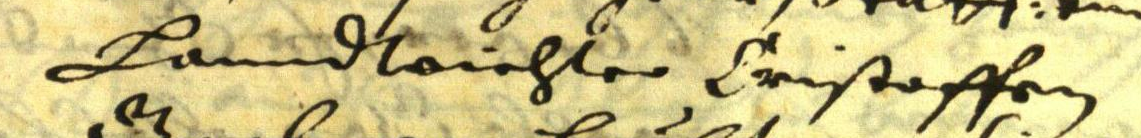Lanndtrichter Cristoffen
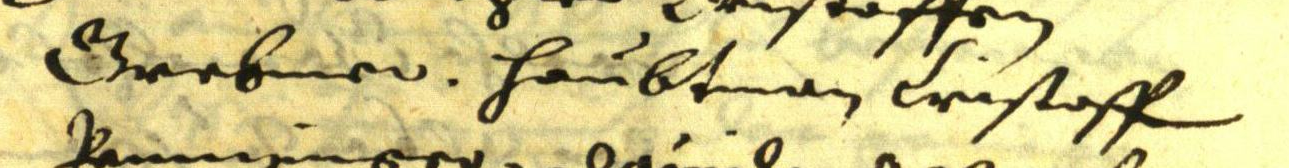Grebmer. Haūbtman Cristoff
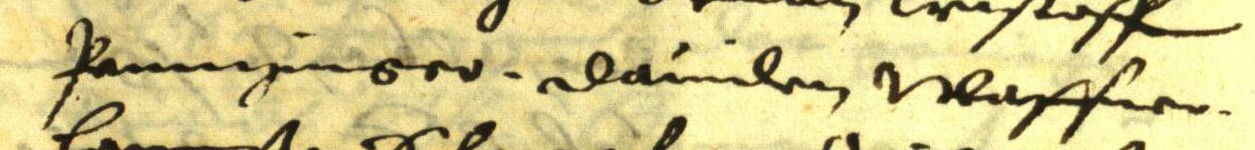Pennzinger. Daūiden Waffner.
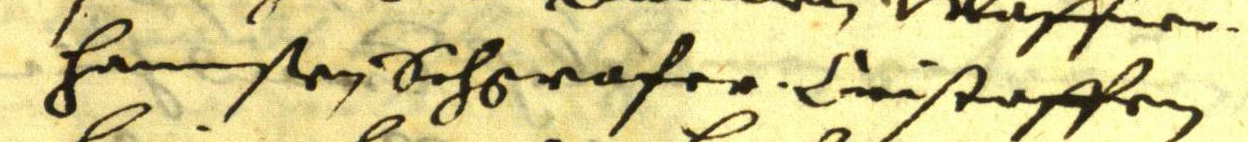hannsen Schgrafer. Cristoffen
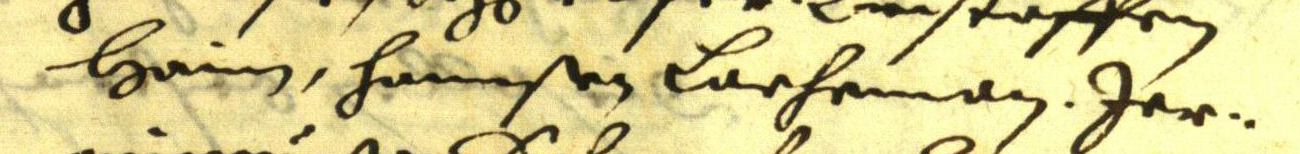Haim, hannsen Locheman. Jer¬
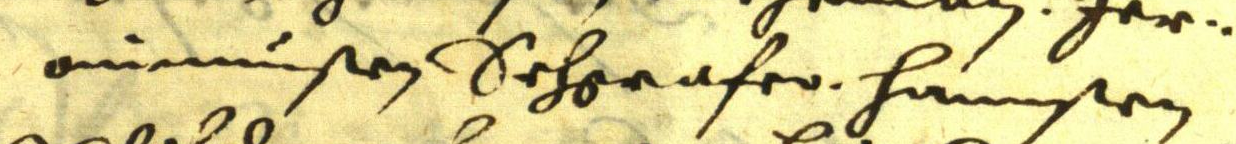onimūsen Schgrafer. hannsen
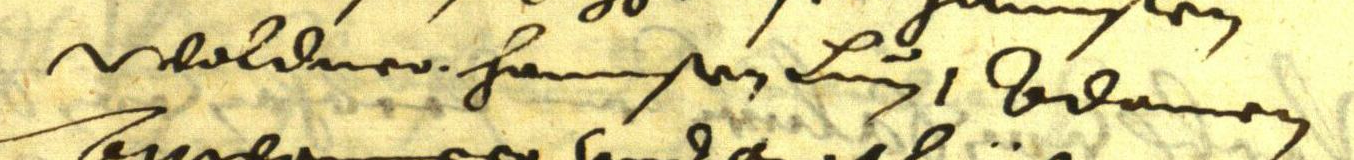Waldner. hannsen Lūn, Adamen
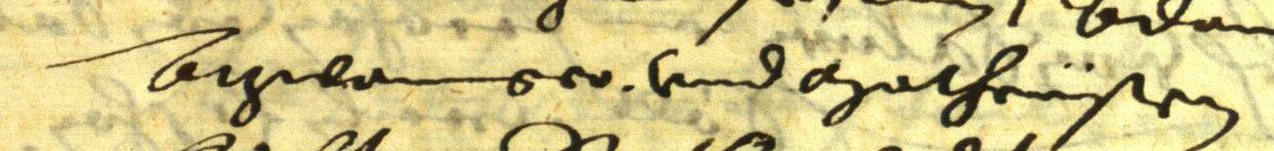Azwannger. vnd Matheüsen
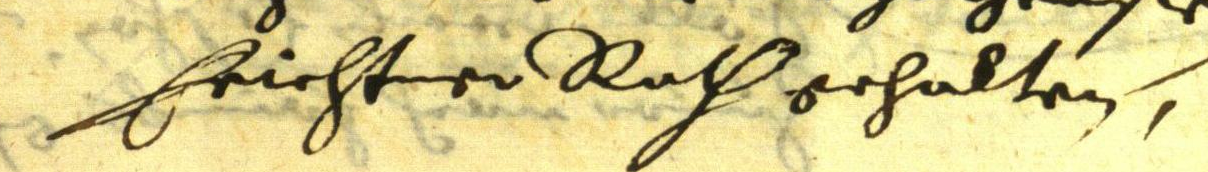Feichtner Rath gehalten,
